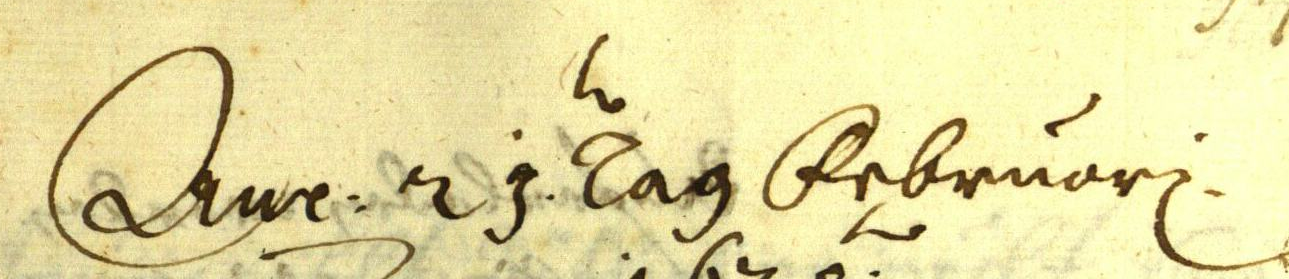Am: 21.t Tag Febrūarj
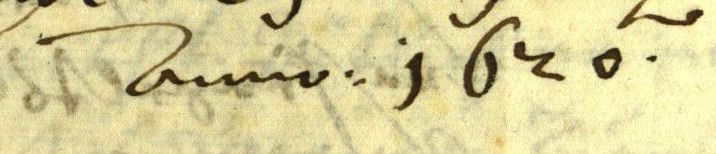Anno: 1620t.
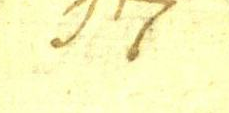17
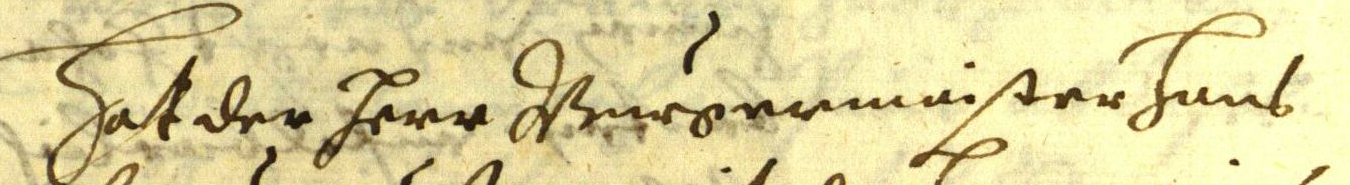Hat der herr Būrgermaister hans
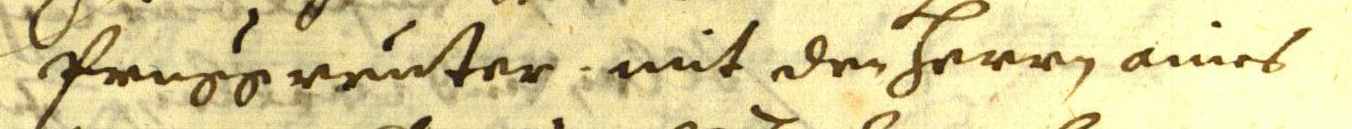Prūggreūter. mit den herrn aines
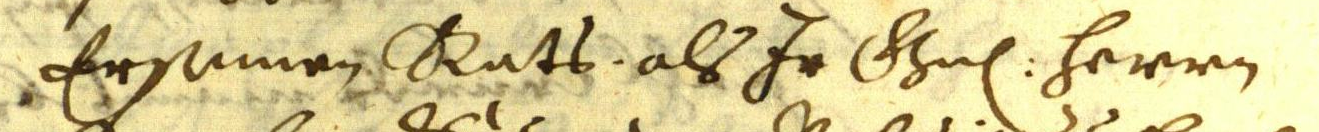Ersamen Rats. als Ir Gn: Herrn
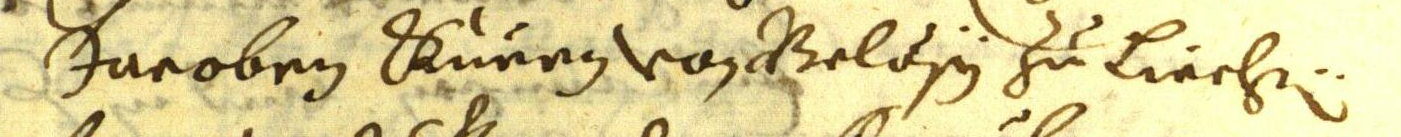Jacoben Kūēen von Belāsȳ zū Liecht¬
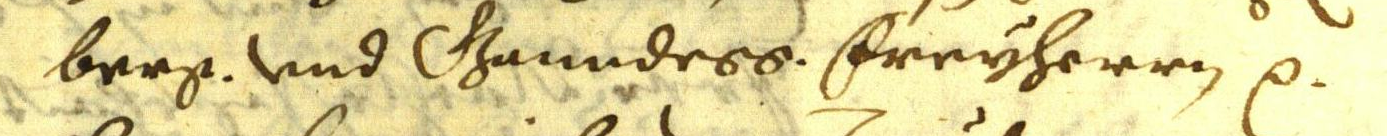berg. vnd Ganndegg. Freȳherrn etc.
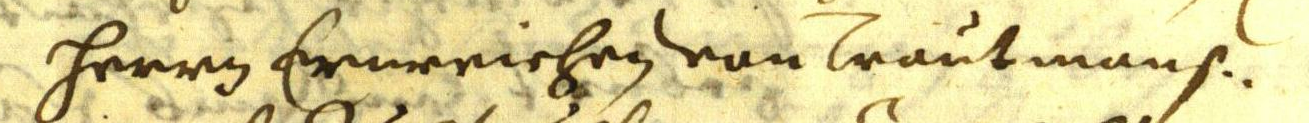herrn Ernreichen von Traūtmans¬
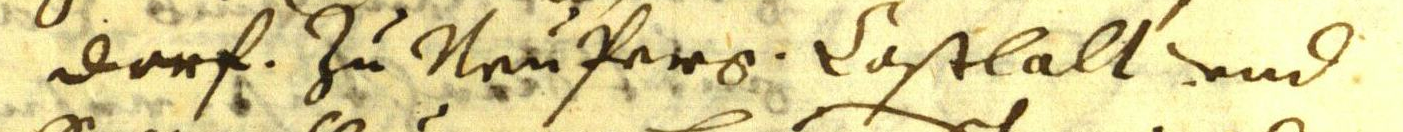dorf. Zū NeūPerg. Castlalt. vnd
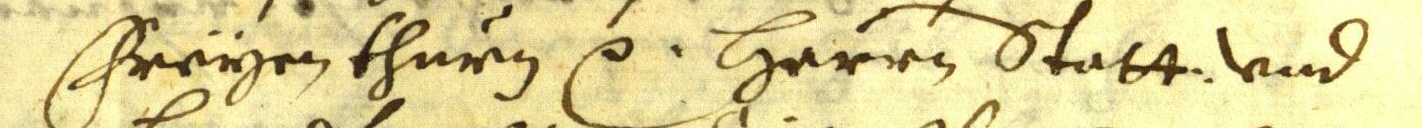Freÿen thūrn etc. Herrn Statt: vnd
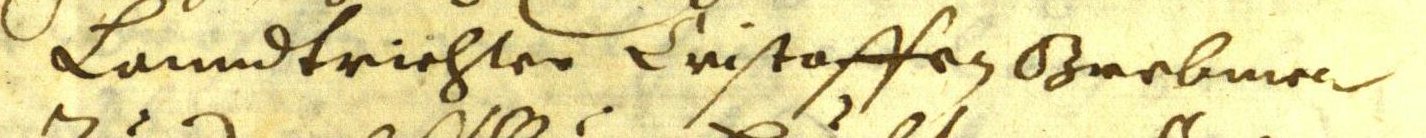Lanndtrichter Cristoffen Grebmer
